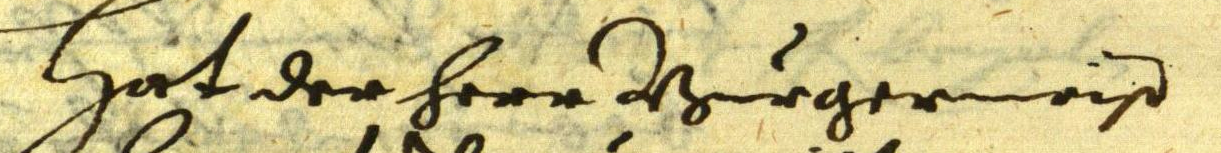Hat der herr Būrgermaist
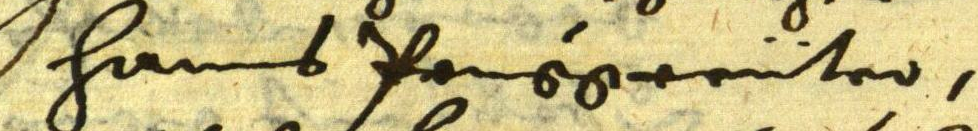Hanns Prūggreüter,
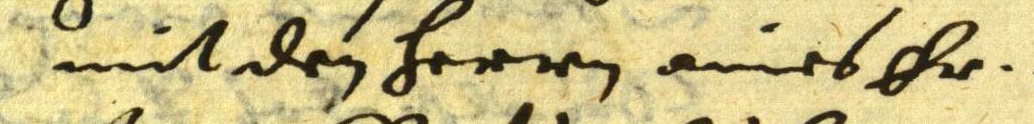mit den herrn aines Er¬
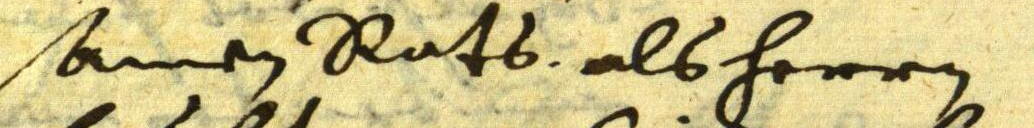samen Rats. als herrn
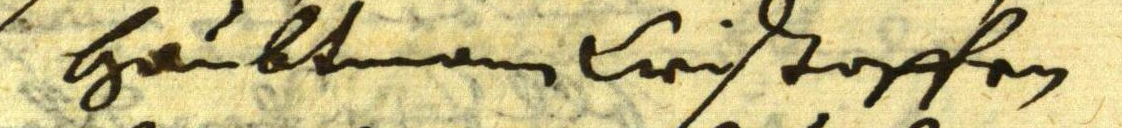Haūbtmann Cristoffen
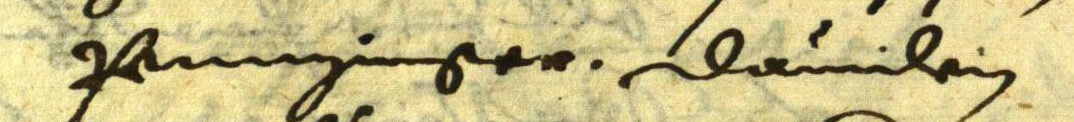Pennzinger. Daūiden
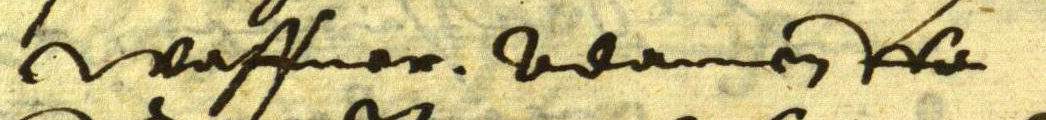Waffner. Adamen Wa
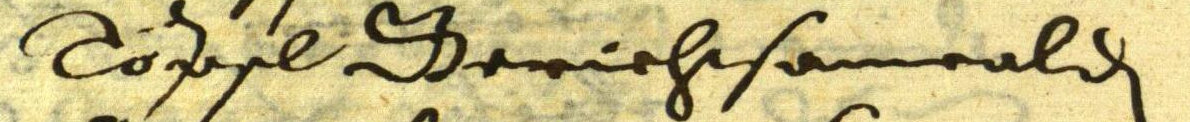TöPsl Gerichtsanwald
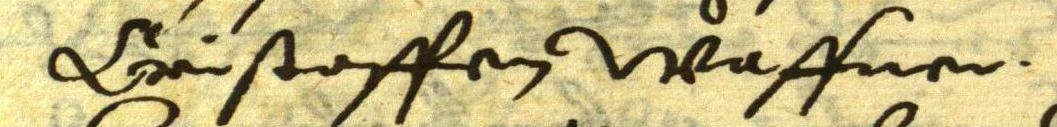Cristoffen Waffner.
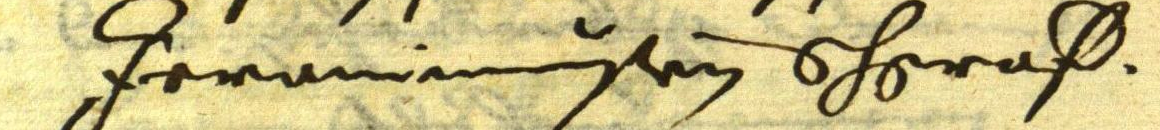Jeronimūsen Schgraf.
